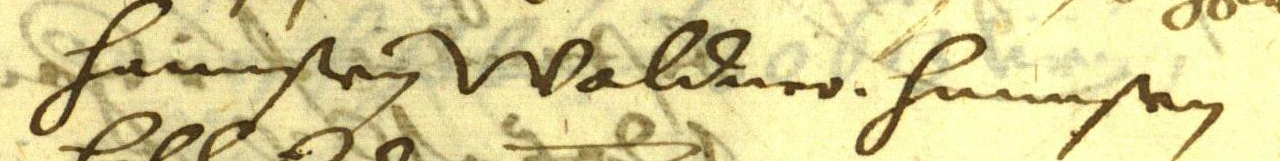hannsen Waldner. hannsen
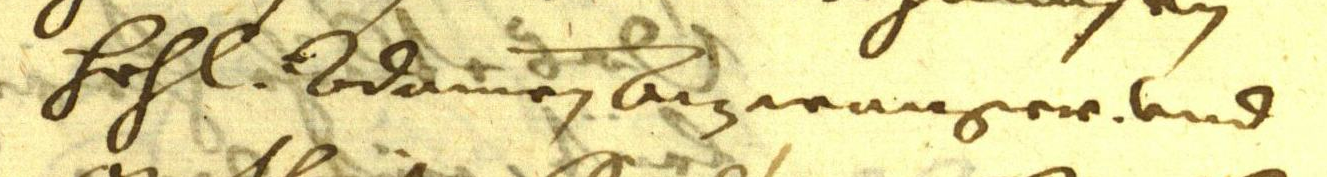hehl. Adamen Azwannger. vnd
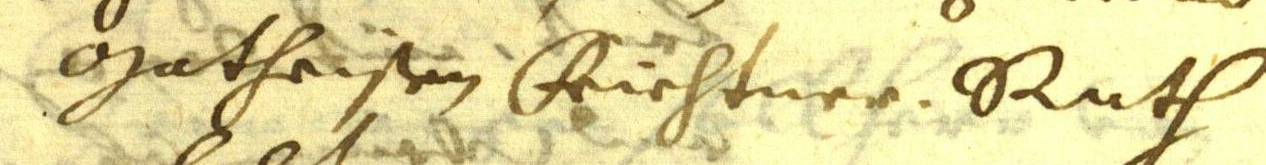Matheisen Feichtner. Rath
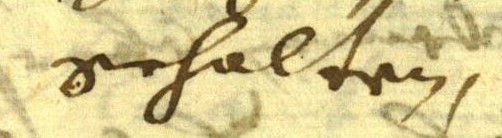gehalten,
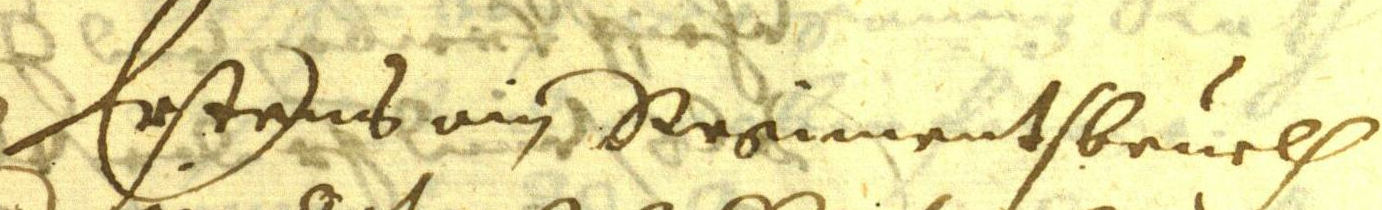Erstens ain Regimentsbeūelh
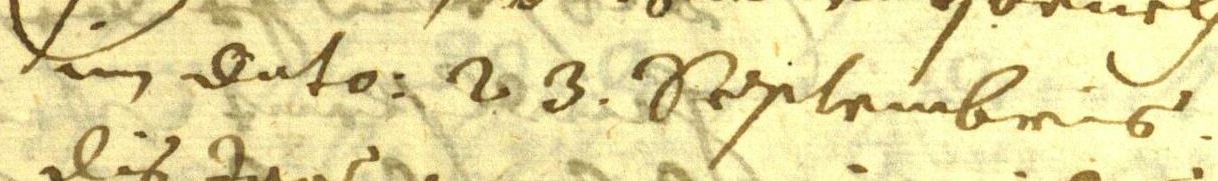im dato: 23. Septembris
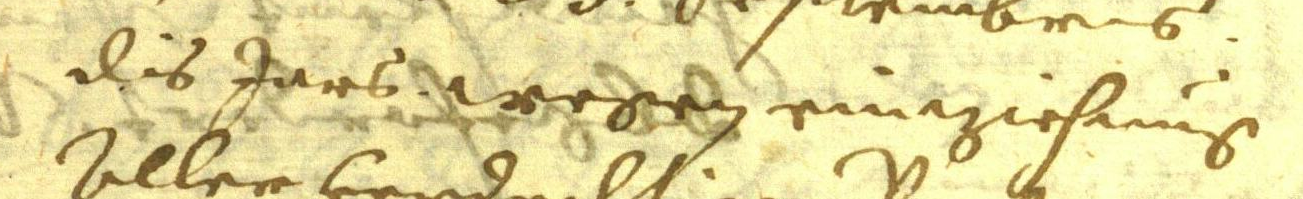dis Jars. wegen einziehūng
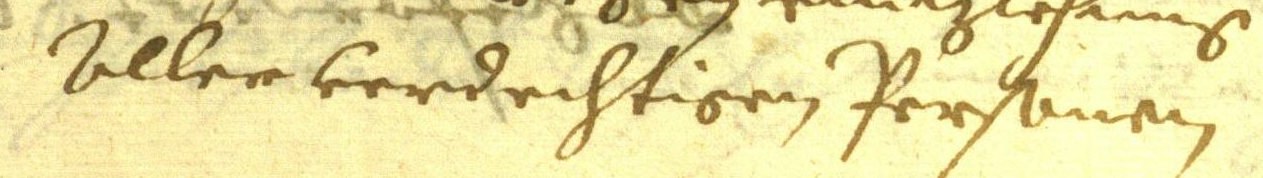Aller verdechtigen Personen
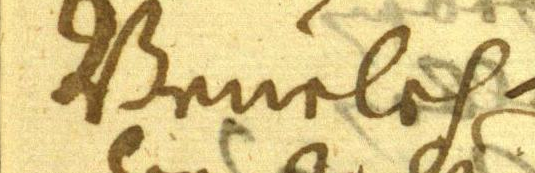Beūelch
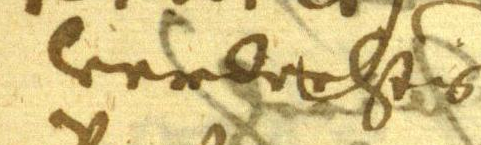verdechtig
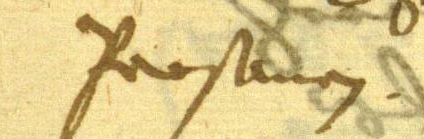Personen.
